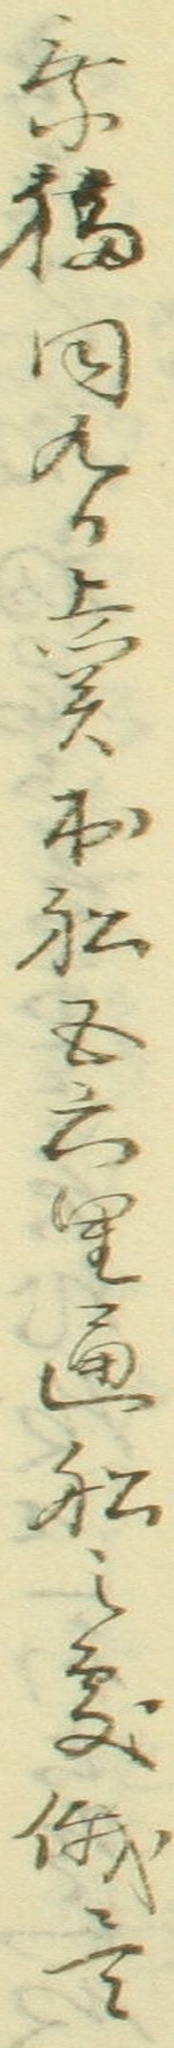乗福岡九日上の関本船五六里通船之處俄に天
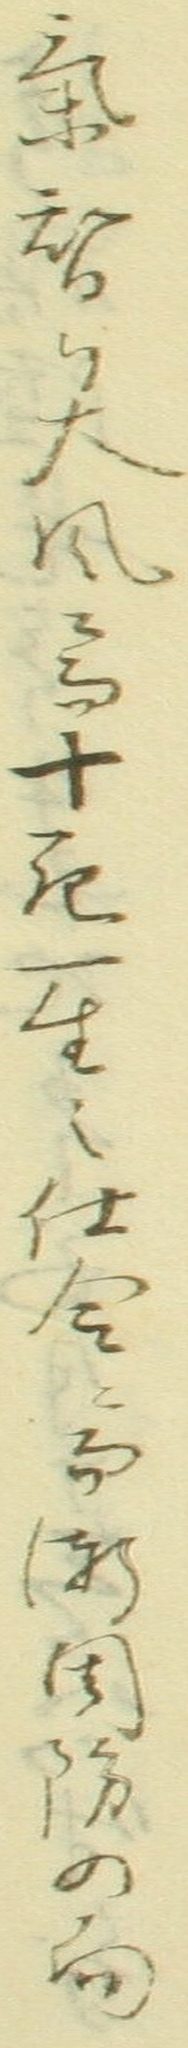気替り大風に而十死一生之仕合に而漸周防の向

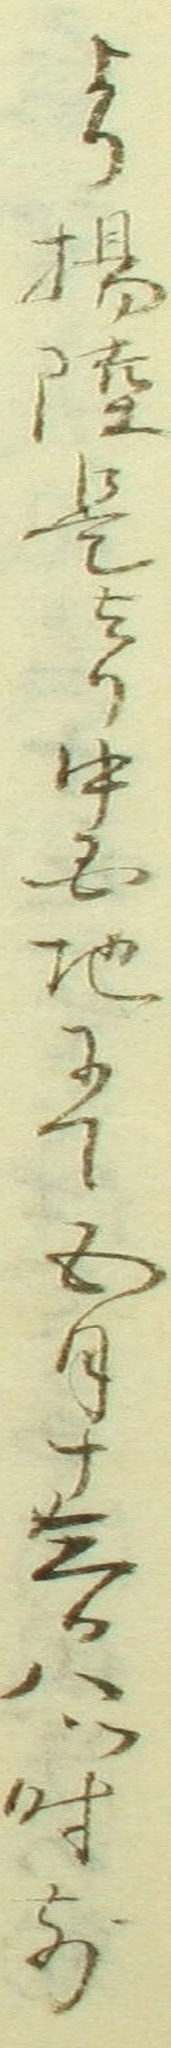より揚陸是より中国地にて五月十三日八ツ時より
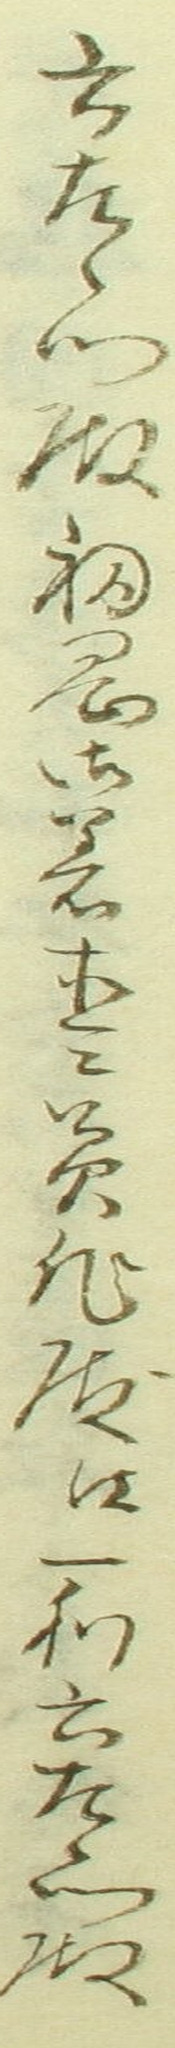六左衛門殿福岡御着置に美作殿江一利六左衛門殿
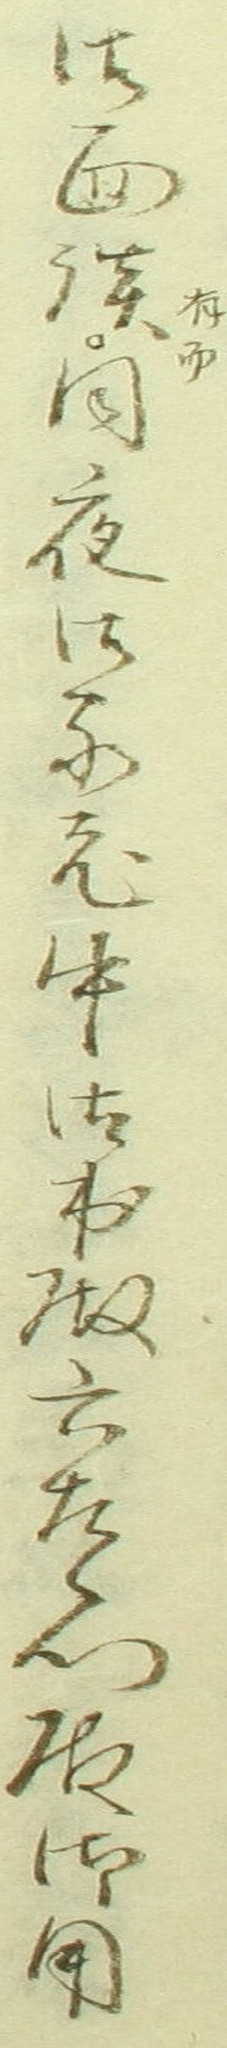御面談有而同夜御家老中御出殿六左衛門殿御用
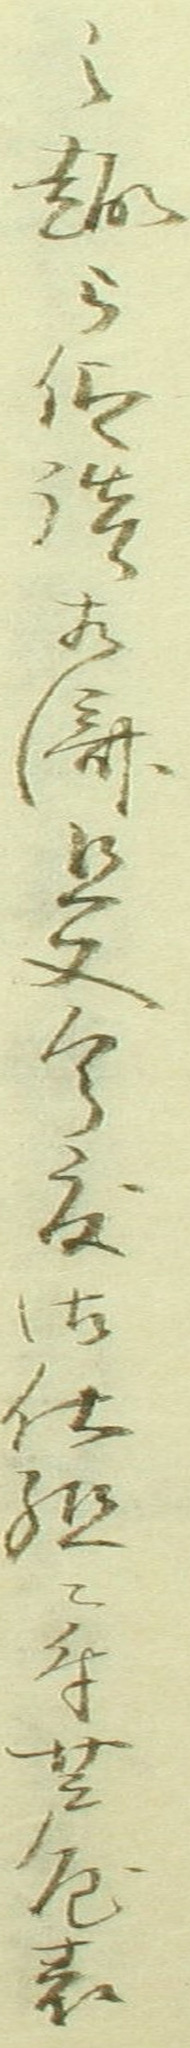之趣被仰詰候相済且又今度御仕組に付芦屋表
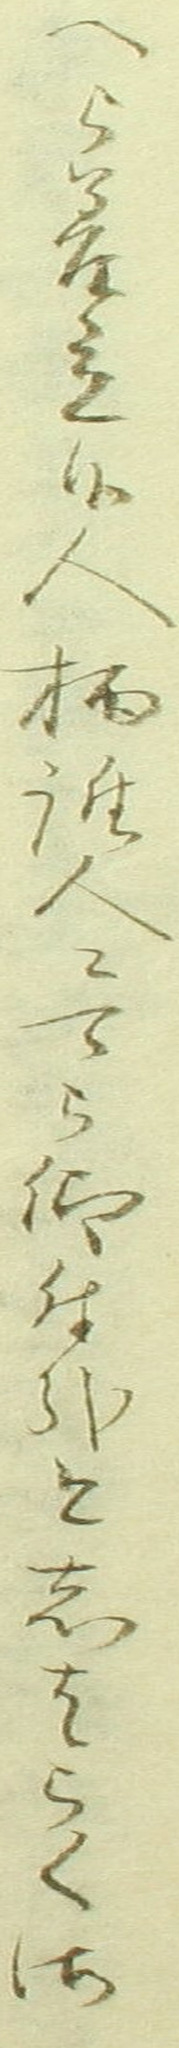へ被差立候人柄誰人にて被仰付哉と志はらく御
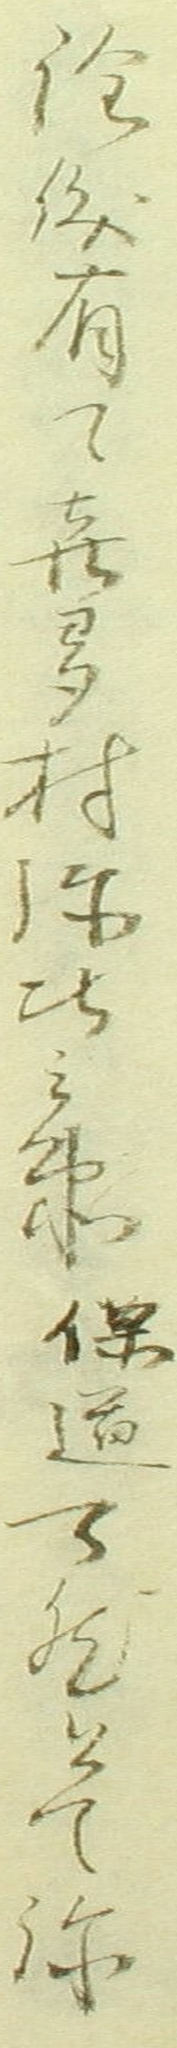詮儀有て喜多村弥次衛門保道可然にて弥
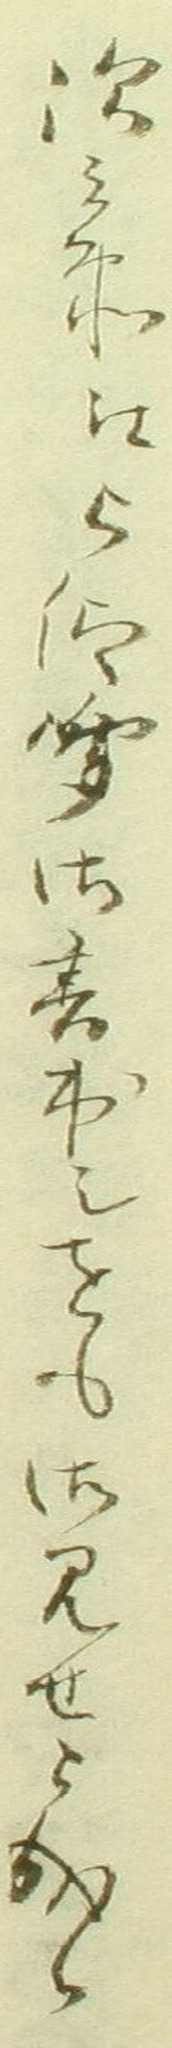次衛門江被仰聞御青出しをも御見せに成候
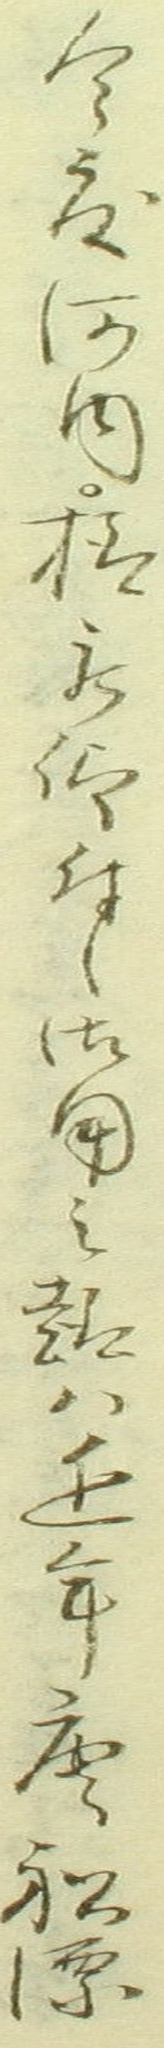今度河内守様被仰付候御用の趣は近年唐船漂
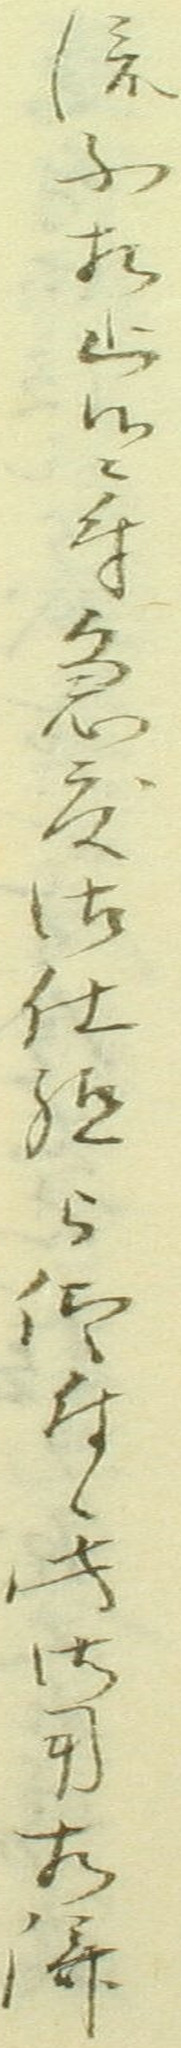流不相止候に付急度御仕組被仰付候時御用相済
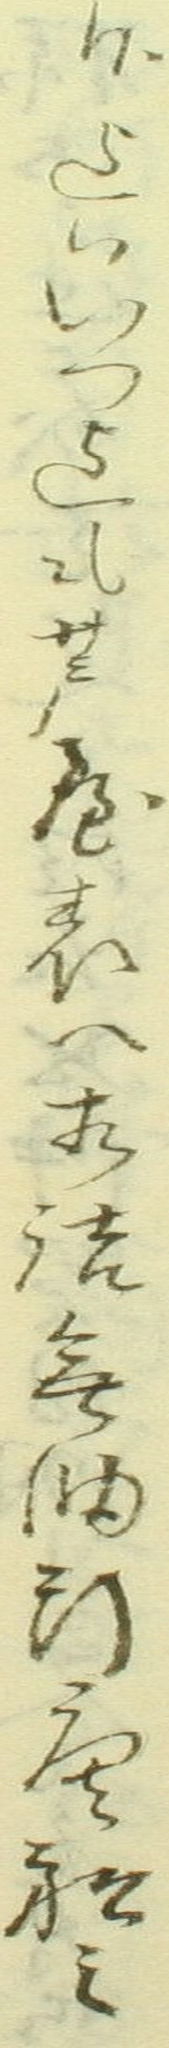候迠はいつ迠も芦屋表へ相詰無油断唐船之
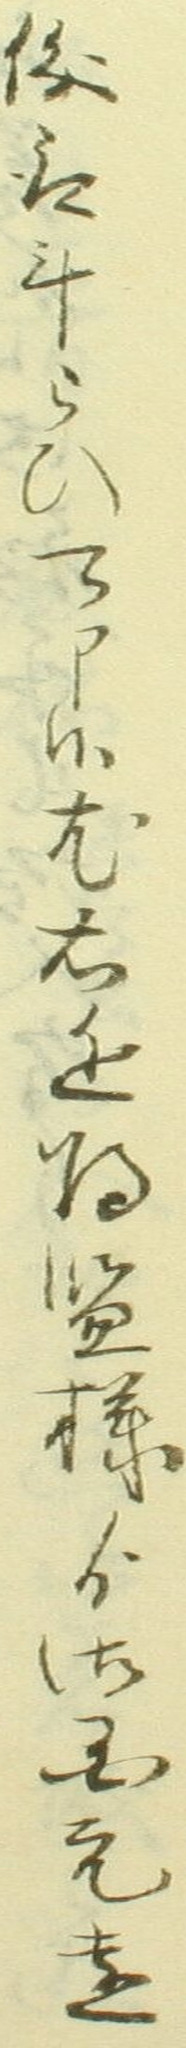儀取斗らひ可申候右近将監様ゟ御国元遠
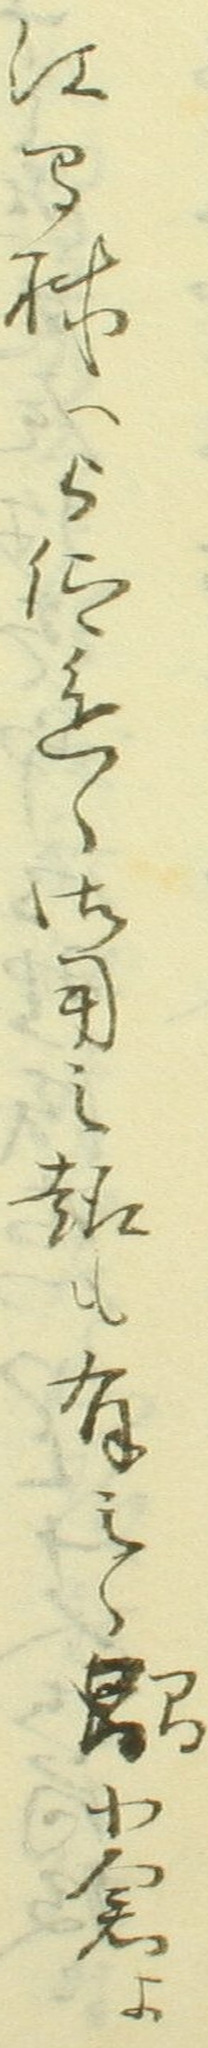江守様へ被仰近近御用之趣も有之候？小倉よ
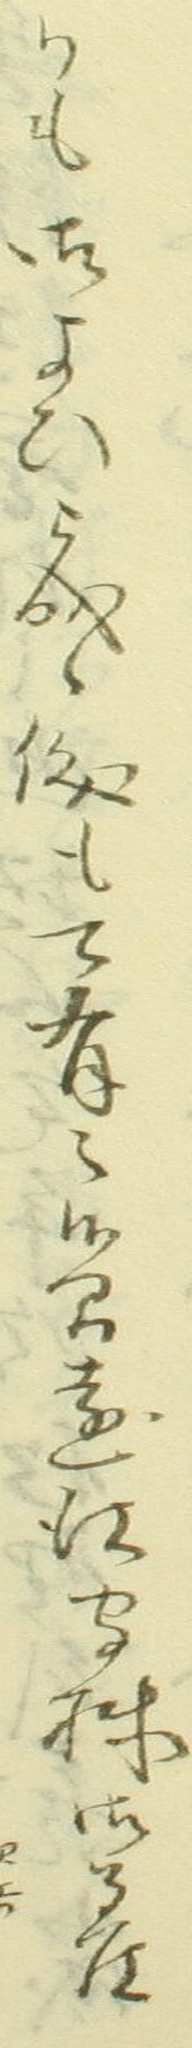りも御よひ被成候儀も可有之候間遠江守様御差
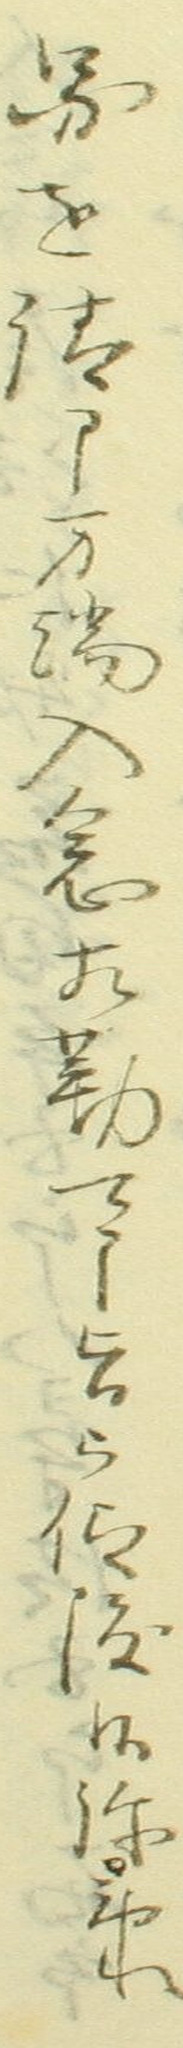図を請申万趨入念相勤可申旨被仰渡候弥次兵衛
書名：唐船漂流記 四
